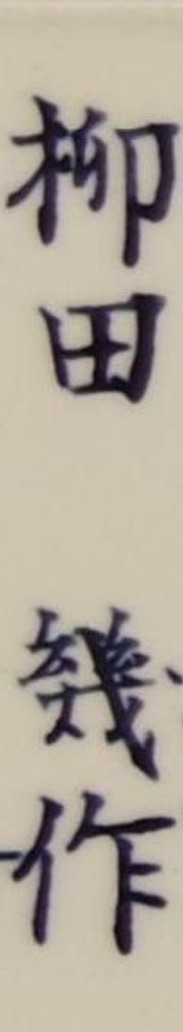柳田幾作

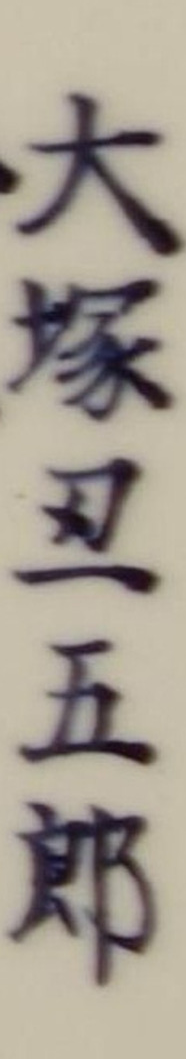大塚丑五郎
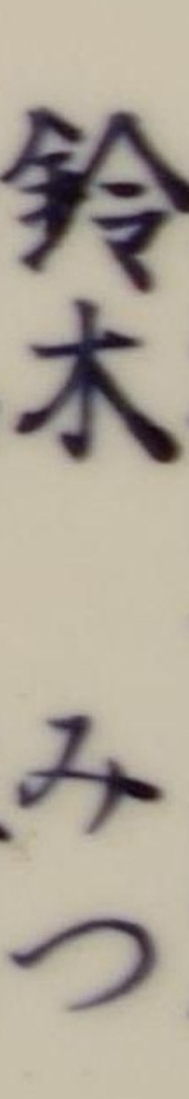鈴木みつ
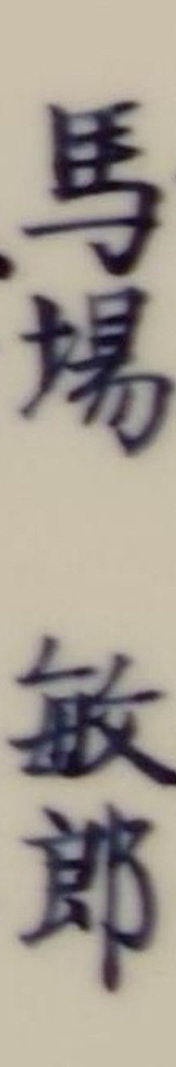馬場敏節
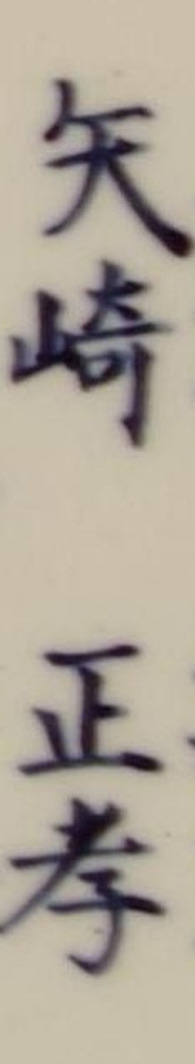矢崎正孝
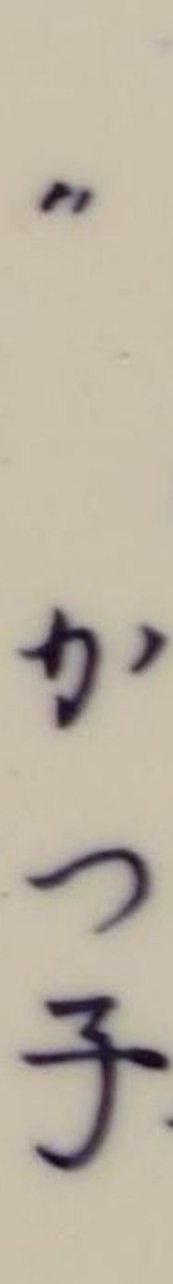かつ子
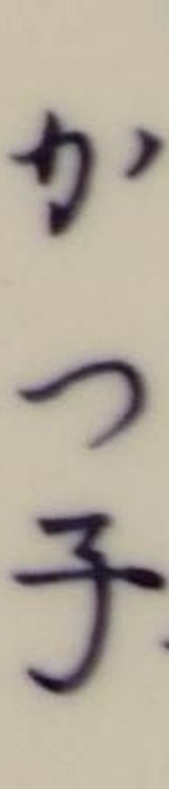かつ子
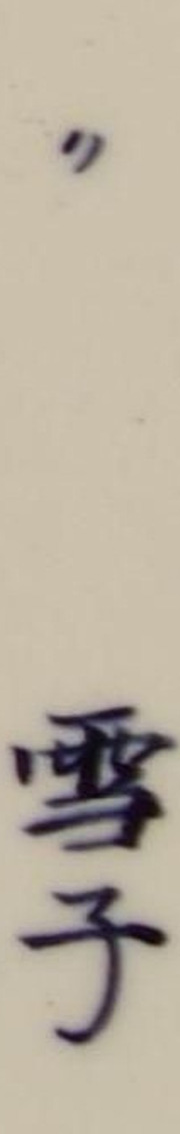かつ子
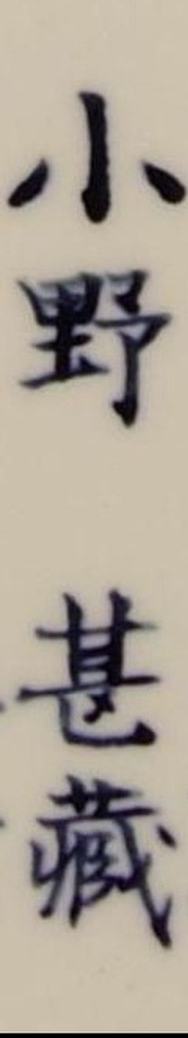小野甚蔵
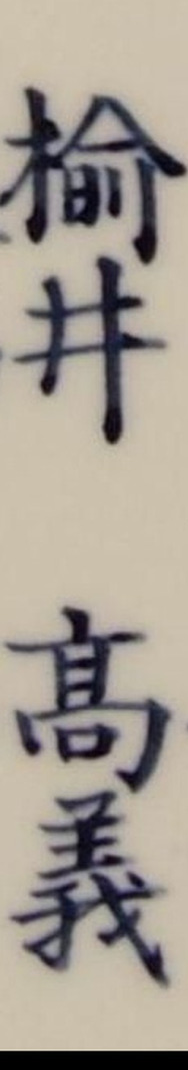楡井高義
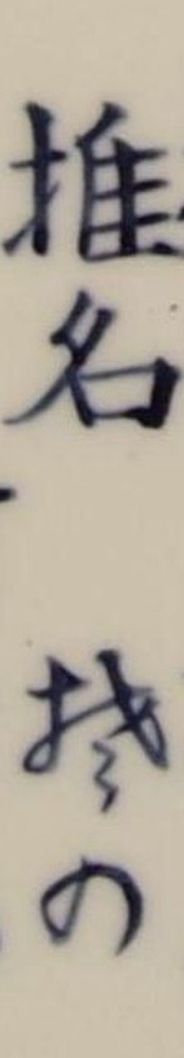椎名その
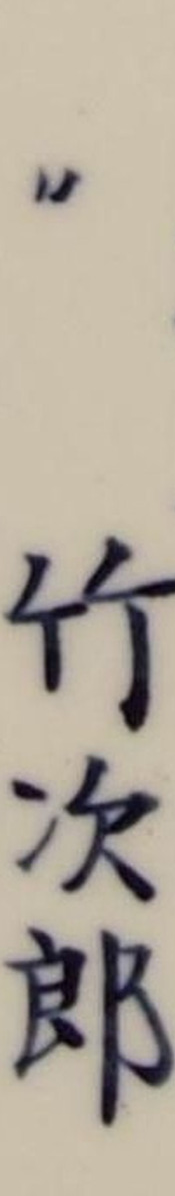竹次郎
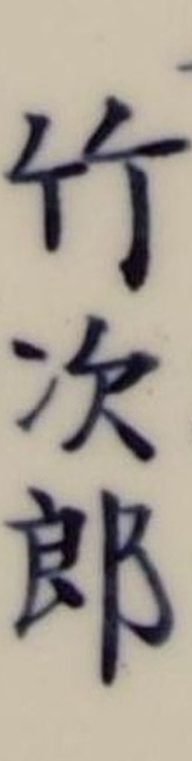竹次郎
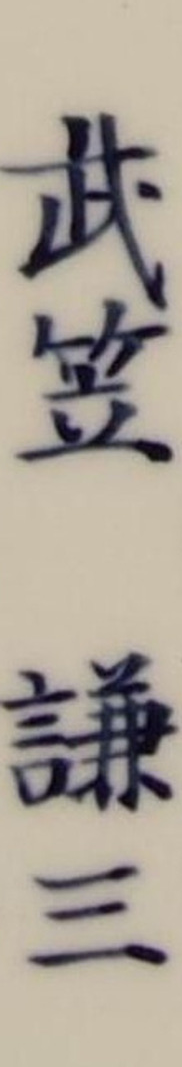武笠謙三
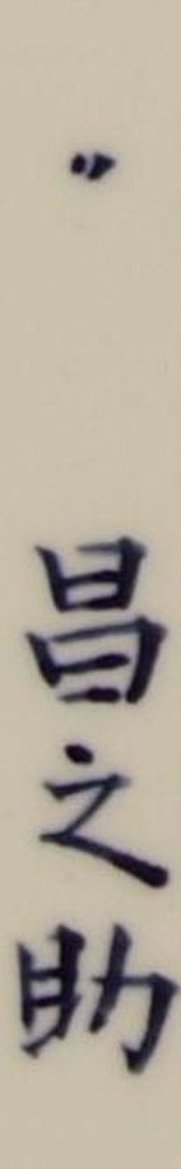昌之助
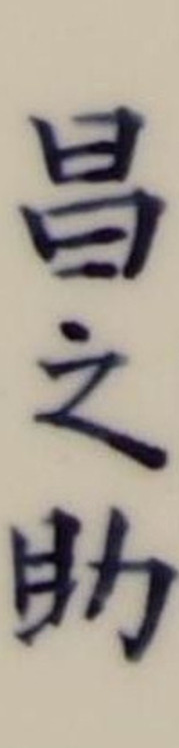昌之助
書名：E~L
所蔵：高野山金剛峯寺
